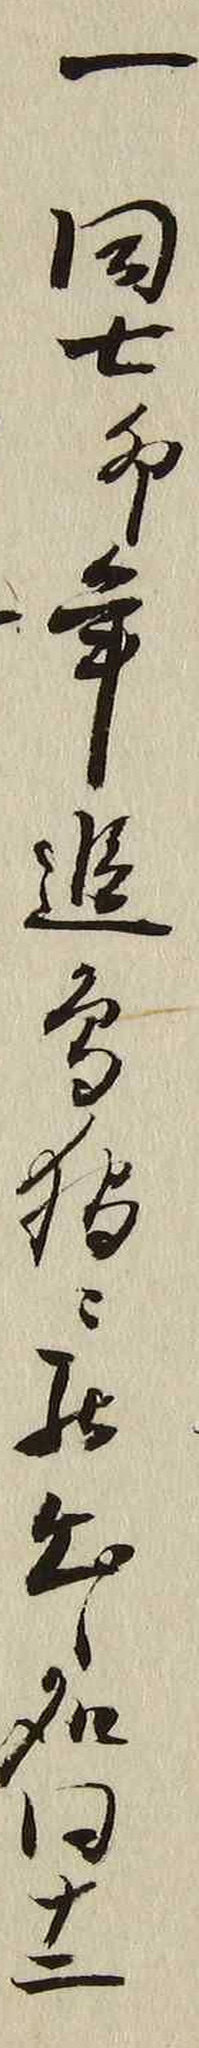一同七卯年追鳥狩ニ罷出候処同十二
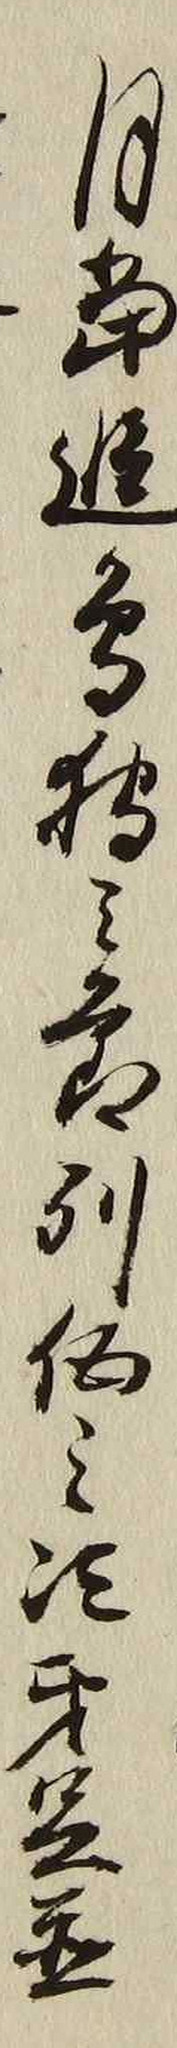月当追鳥狩之節列伍之次第足並
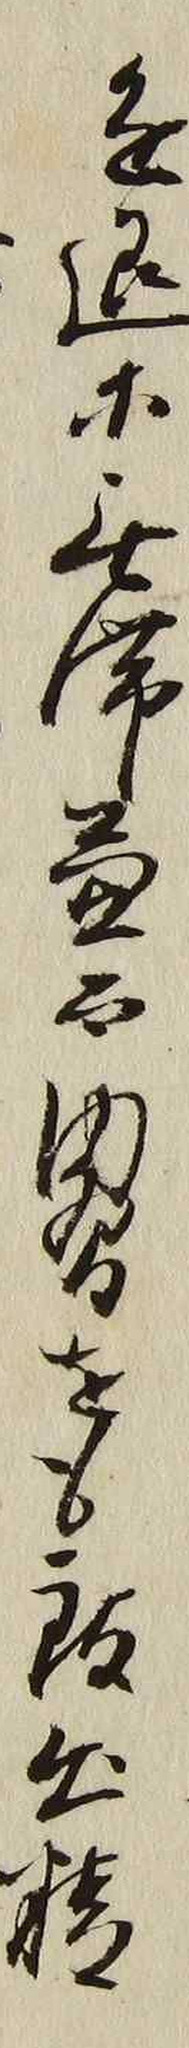進退等無滞兼而内習をも致出精
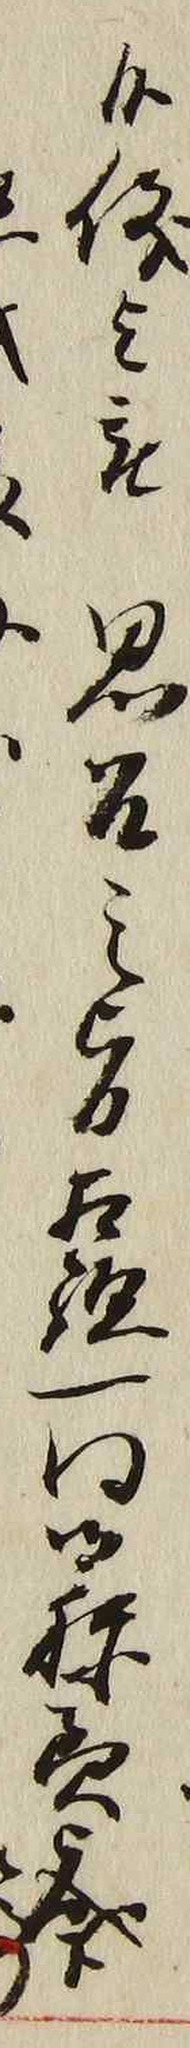候儀与被思召之旨相組一同御称美被成下候事
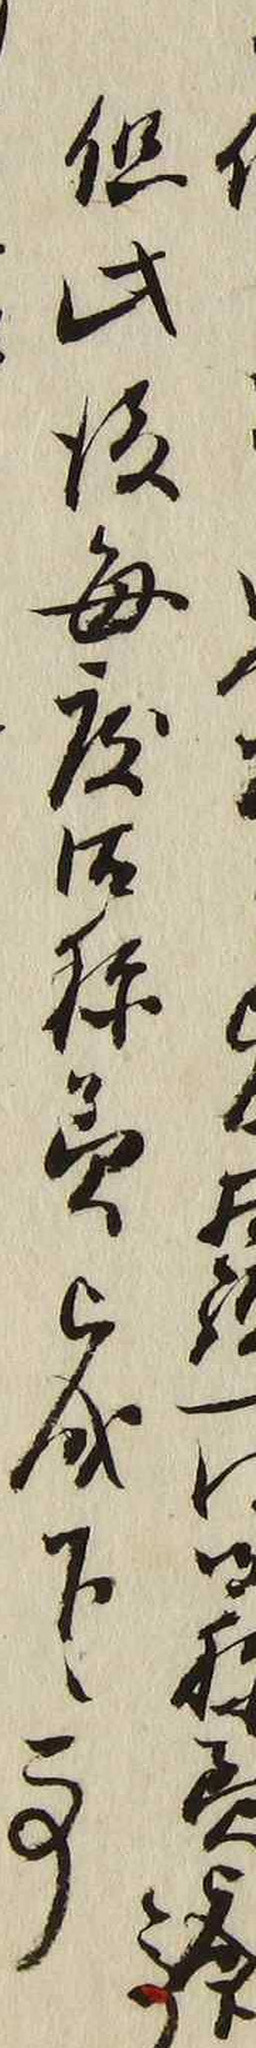但此後毎度御称美被成下候事
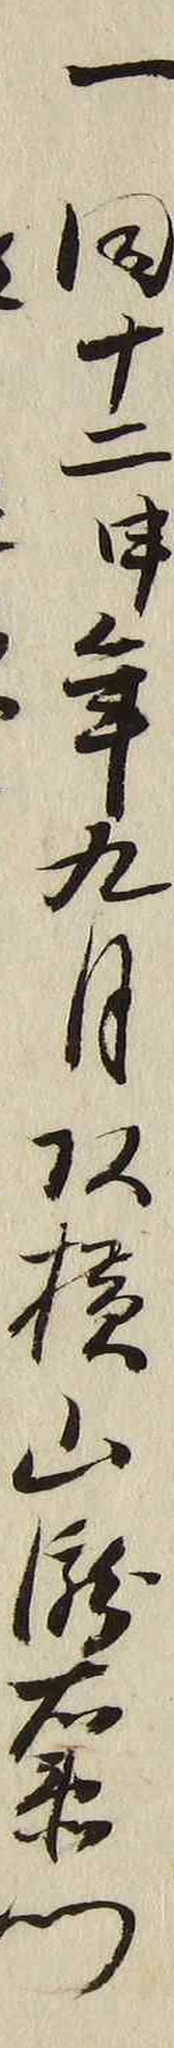一同十二申年九月頭横山瀧右衛門
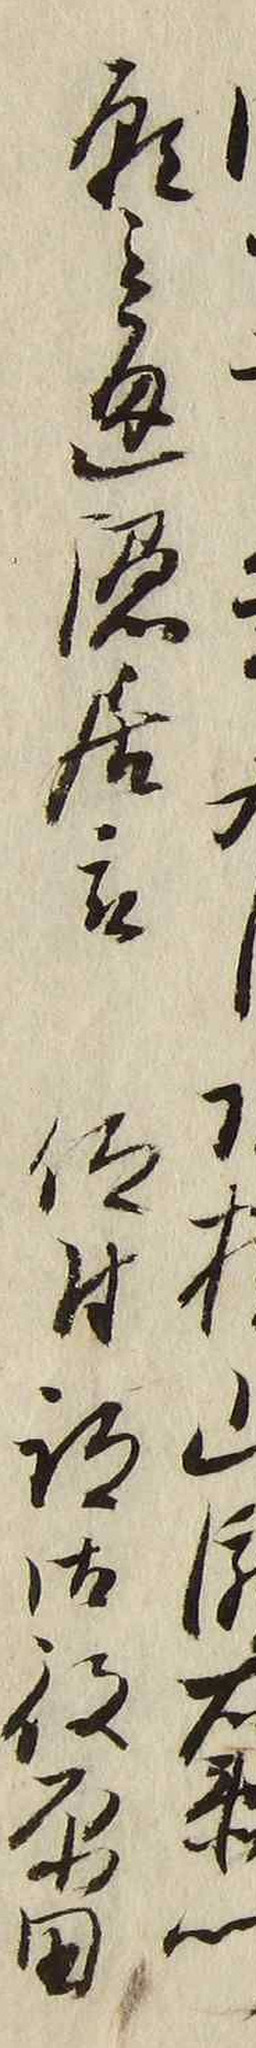願之通隠居被仰付跡御役原田

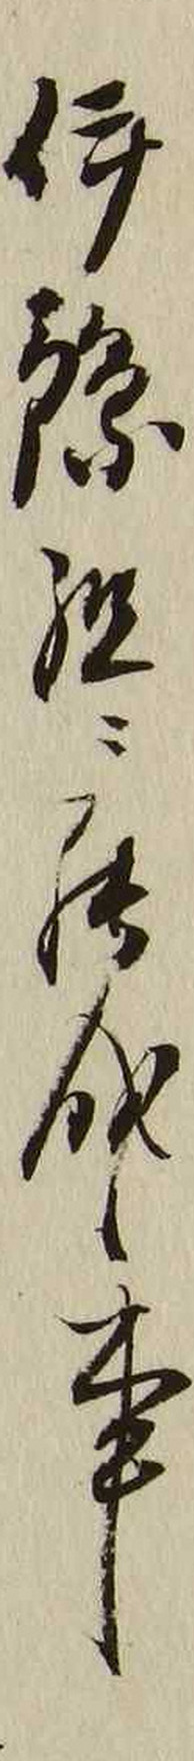伊予組ニ罷成候事
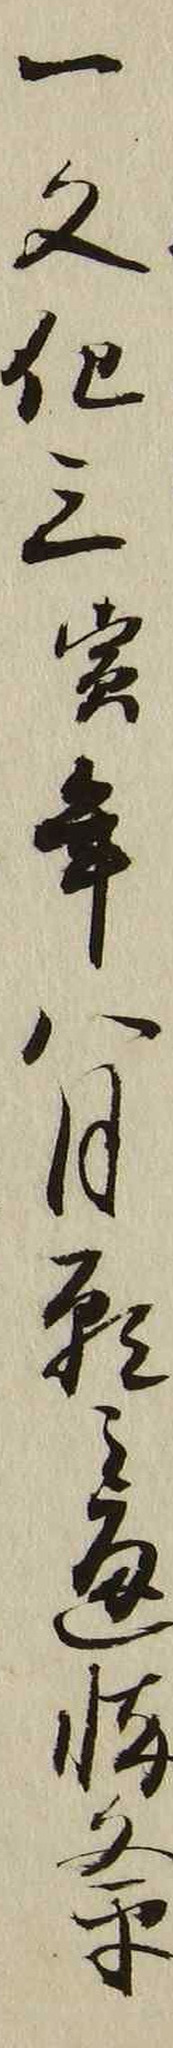一文化三寅年八月願之通忰文平
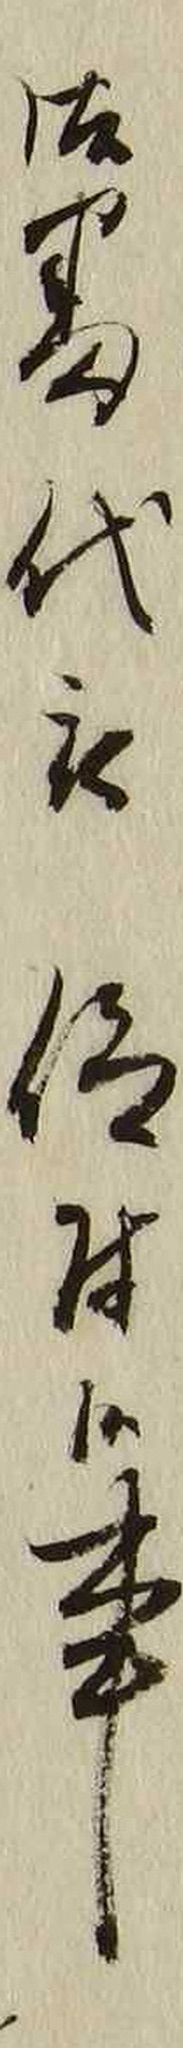御番代被仰付候事
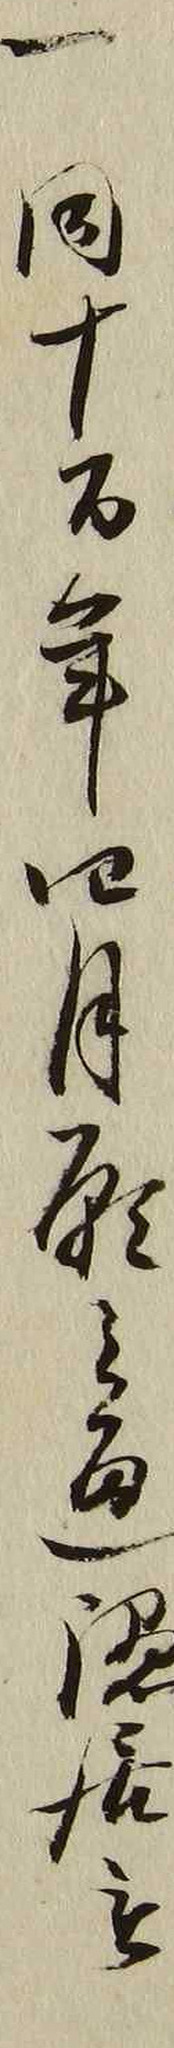一同十酉年四月願之通隠居被
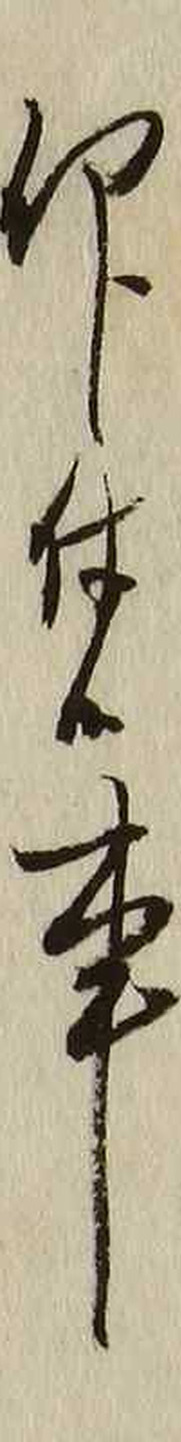仰付候事
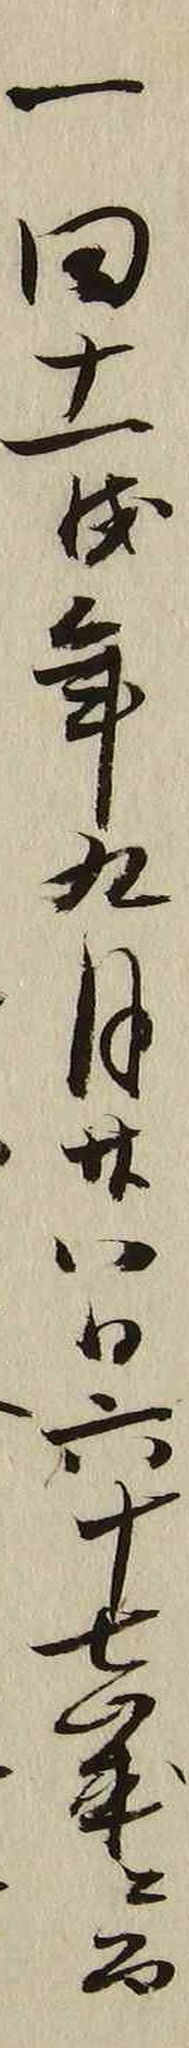一同十一戌年九月廿八日六十七歳ニ而
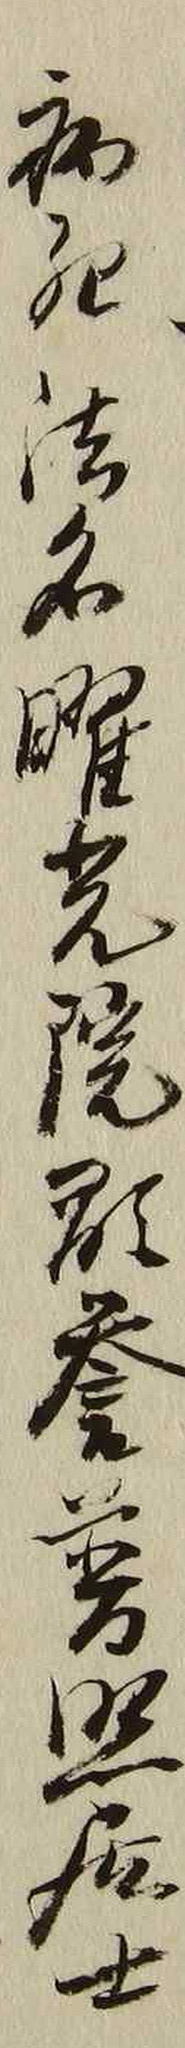病死法名曜光院顕誉普照居士
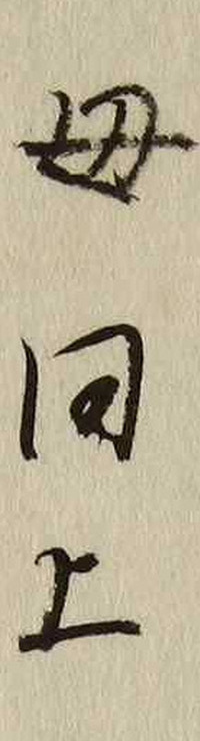母同上
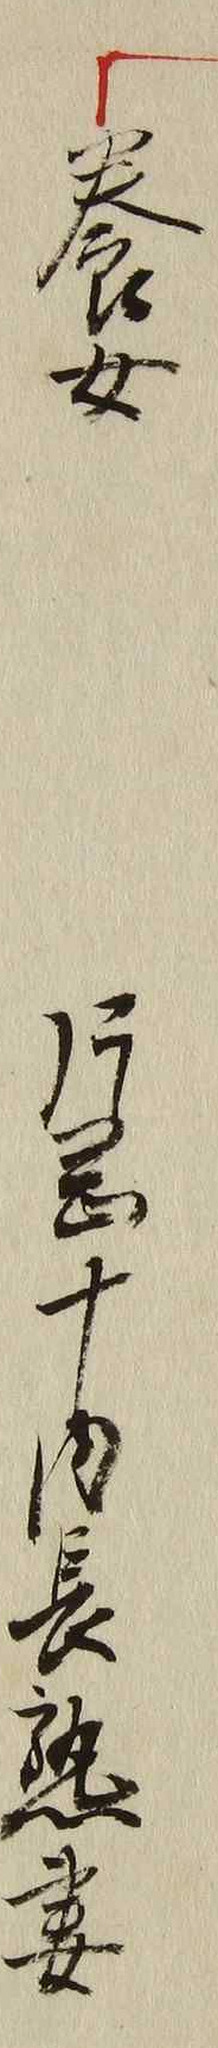養女片岡十内長熟妻
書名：諸士系譜　巻之348　も之部4
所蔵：会津若松市立会津図書館
